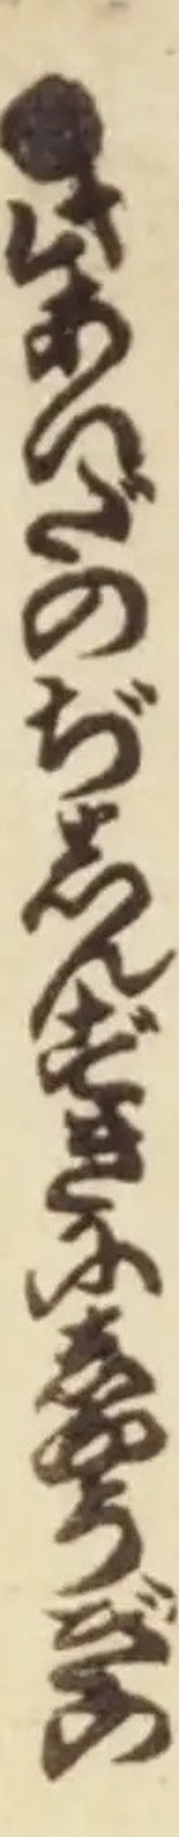●此あいだのぢしんずきにしやうぎの
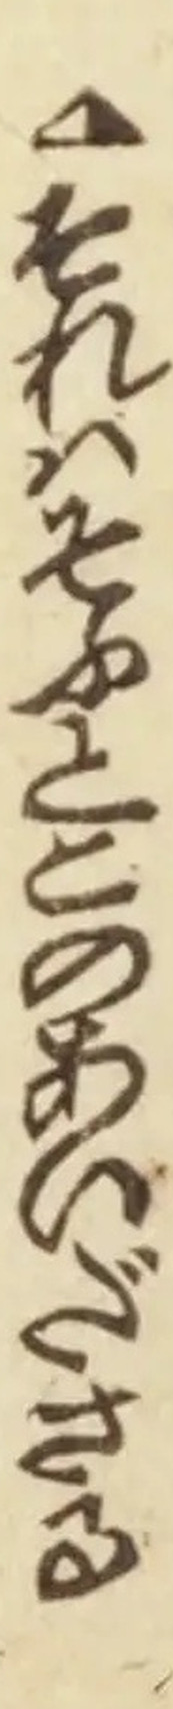△それはそふとこのあいださる
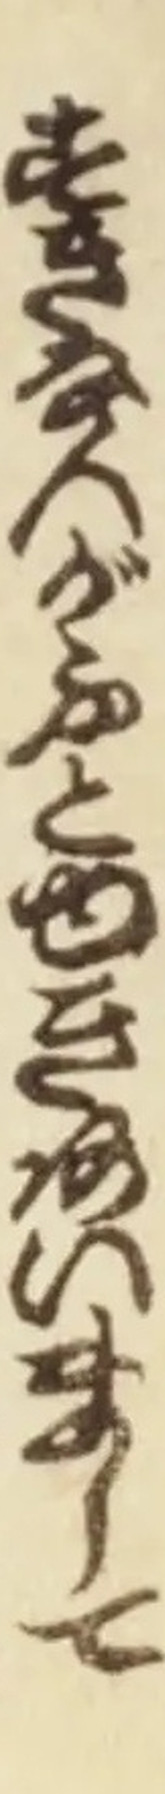すきな人がふとゆきあいまして
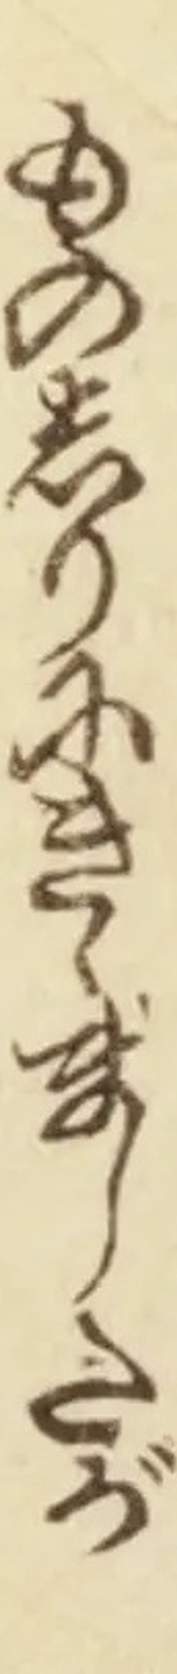ものしりにきゝましたが
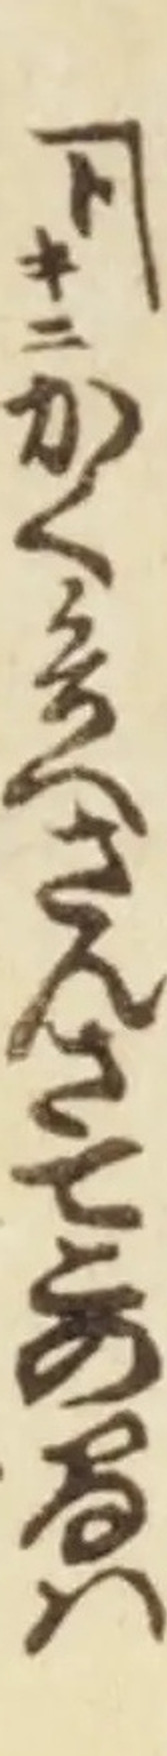〽トキニかく兵へさんさてこの間は
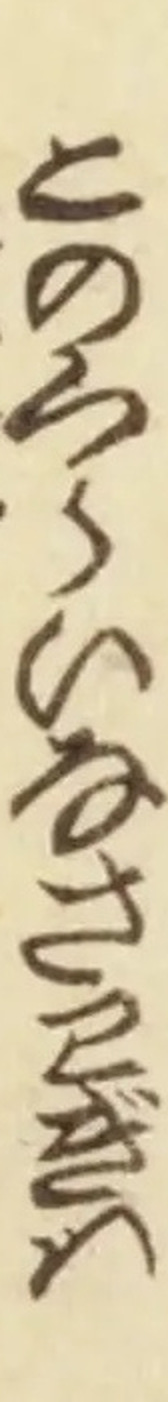このくらいなさわぎは
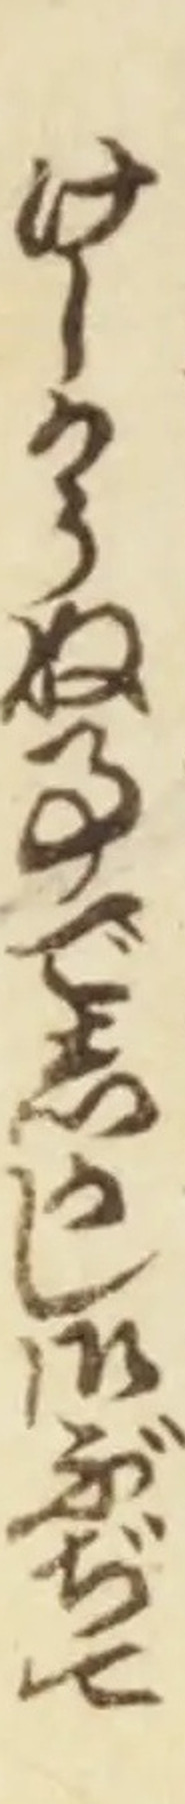けしからぬ事でしかし御ぶぢて
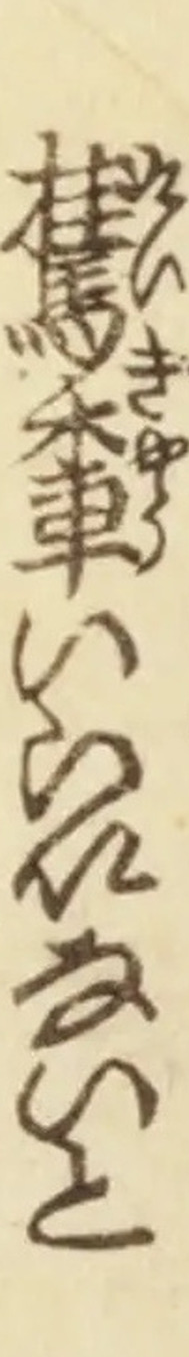桂馬禾車いらいないと
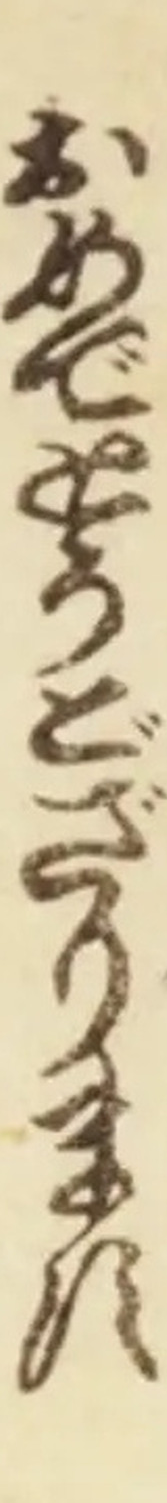おめでとうござります
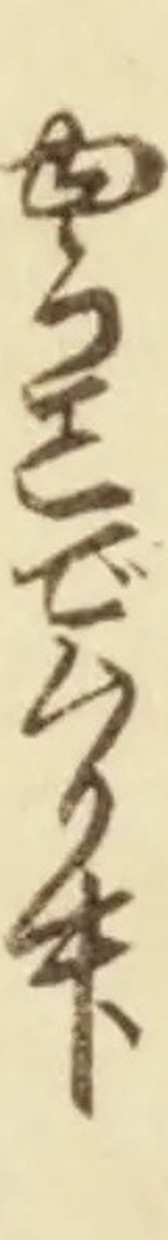ゆうことで厶り升
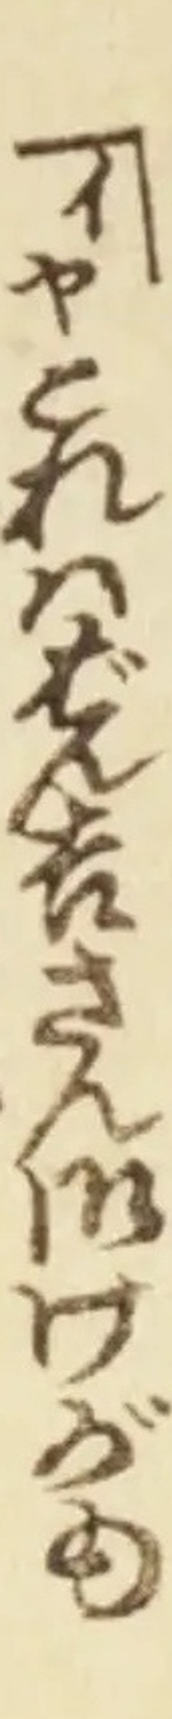〽イヤこれはばん吉さん御けがも
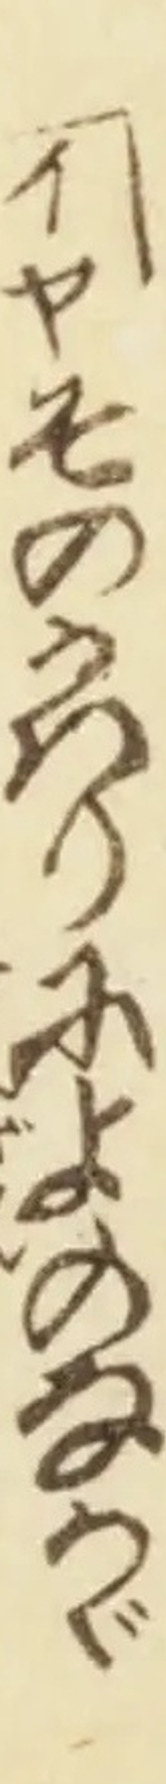〽イヤそのかわりによのなかゞ
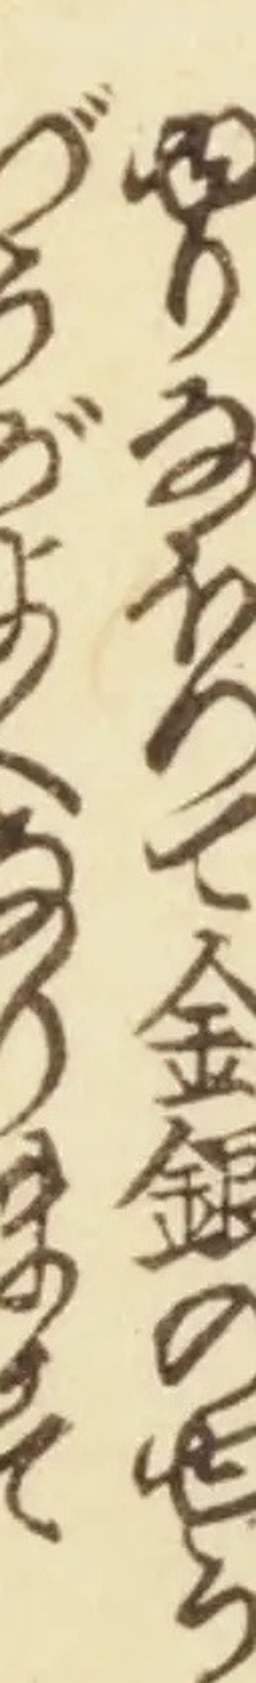づうがよくなります
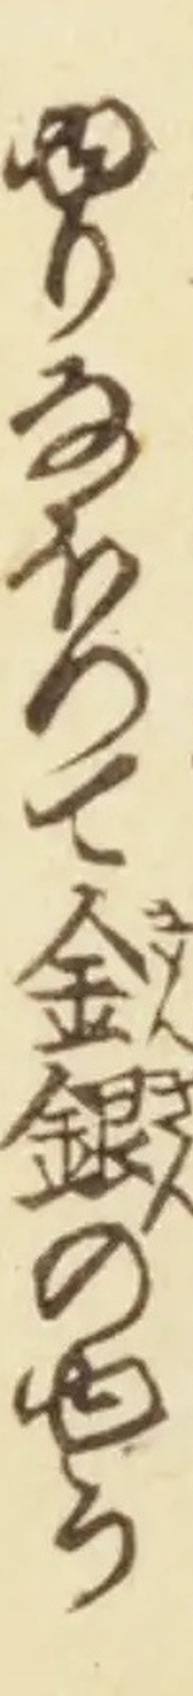ゆりなほつて金銀のゆう
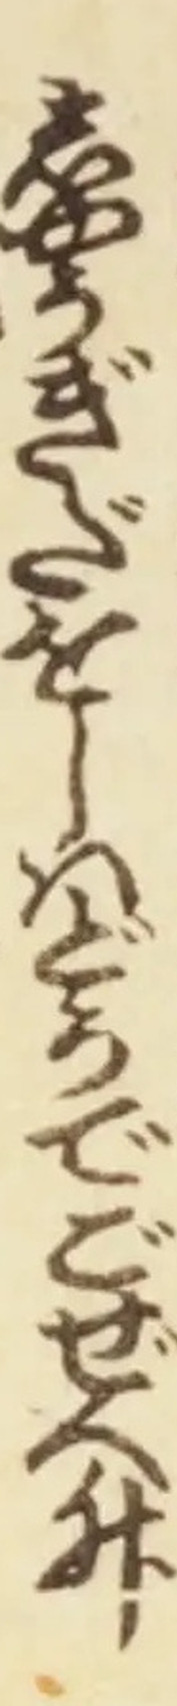しやうぎだをしはどうでごぜへ升
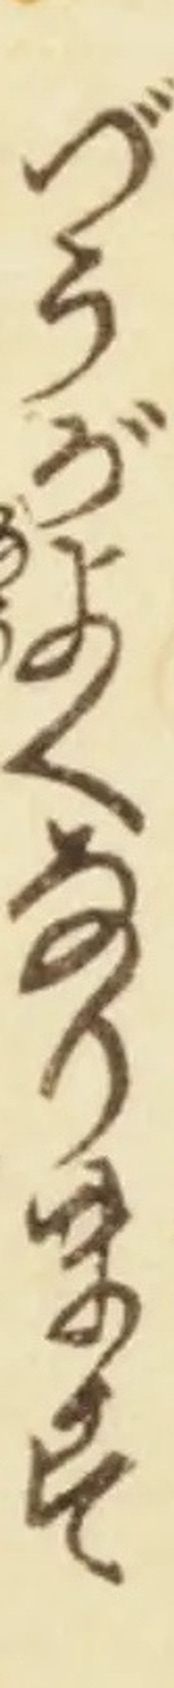づうがよくなります
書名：二日はなし地震亭念魚町々庵炎上
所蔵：国立国会図書館 National Diet Library, JAPAN
